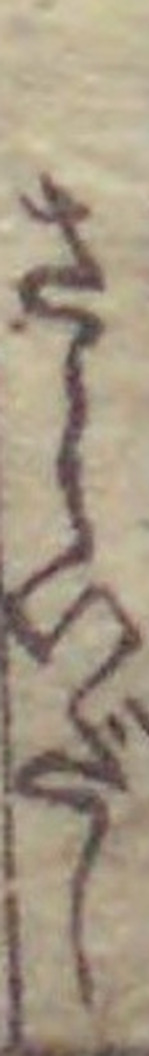さしいだし
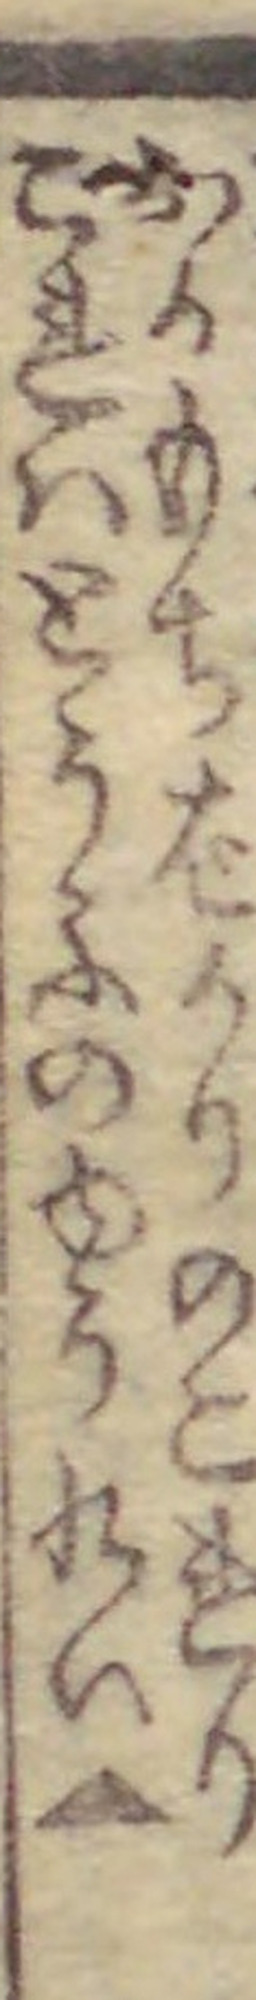これはとうふのゆうれい▲
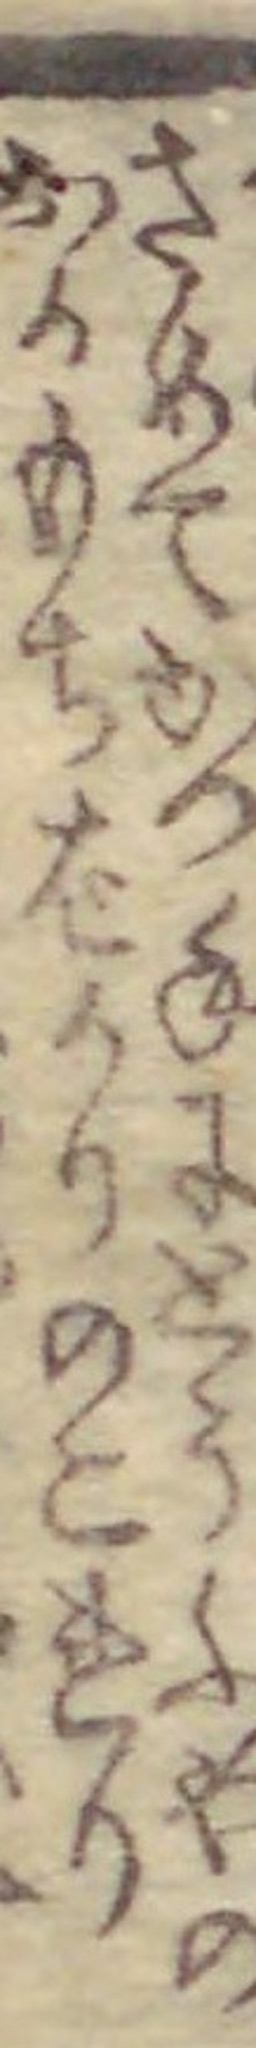おかもちばかりのこれり
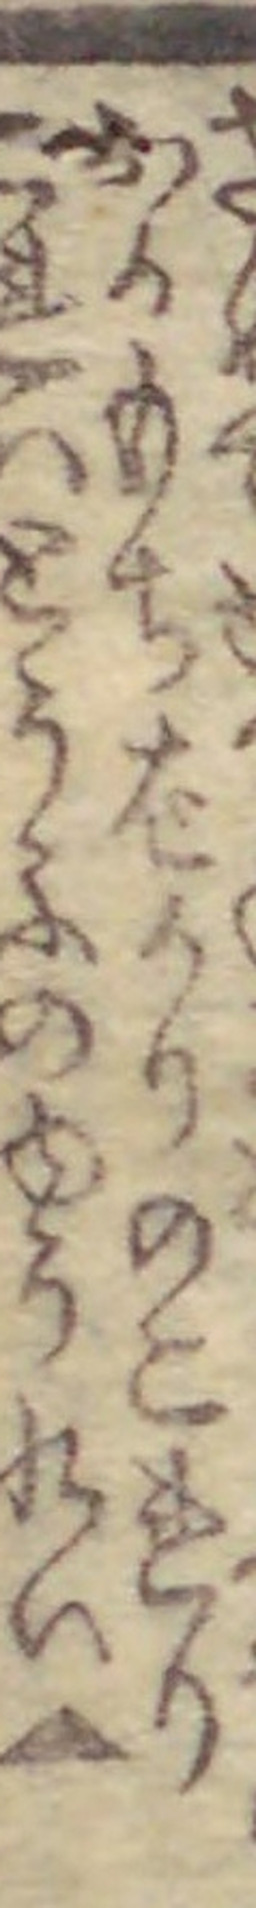これはとうふのゆうれい▲
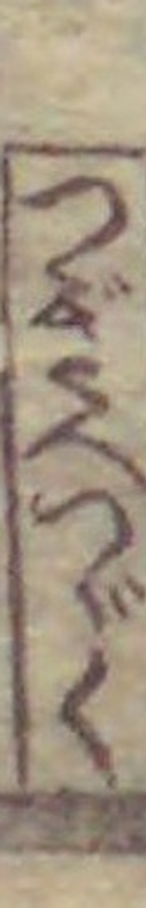つぎへつづく

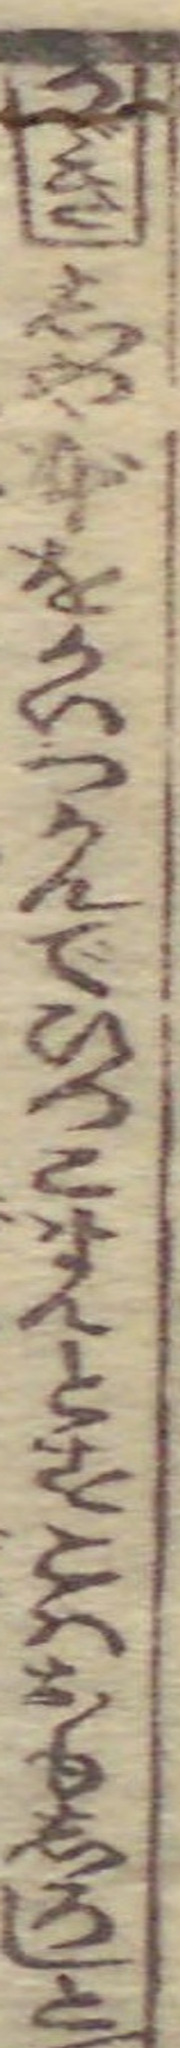つづきしや本をかいつかんでひつこまんとすこはおもしろしと
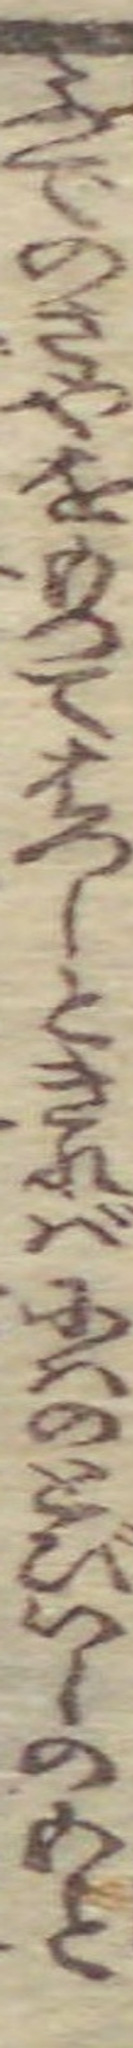ふでのさやをもつてはつしときればにはのとびいしのもと
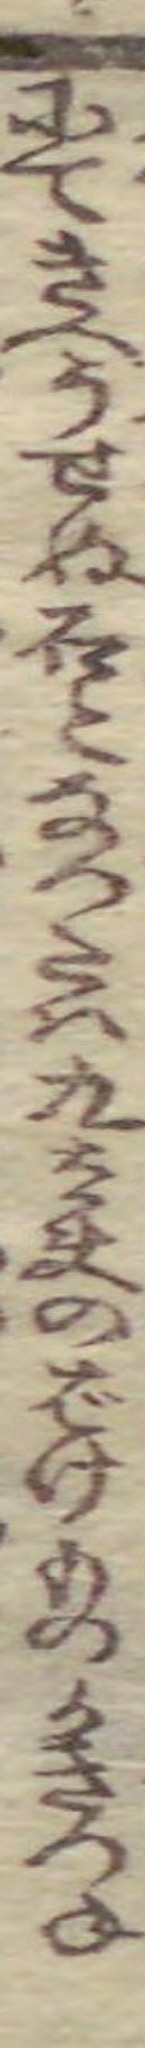にてきへうせぬ石となつたは九太夫のばけものかきつね
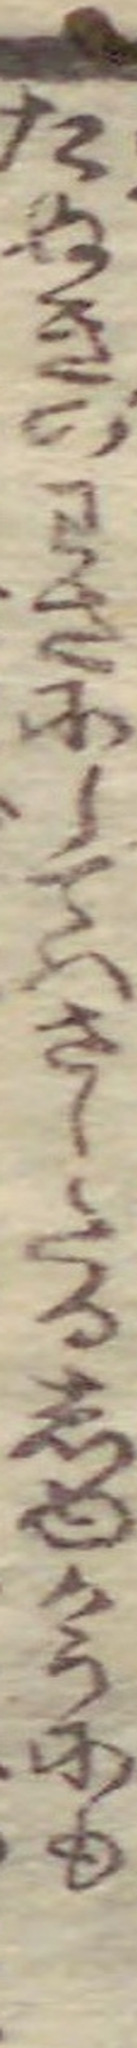たぬきのわさにしてはさしたるしゆかうにも
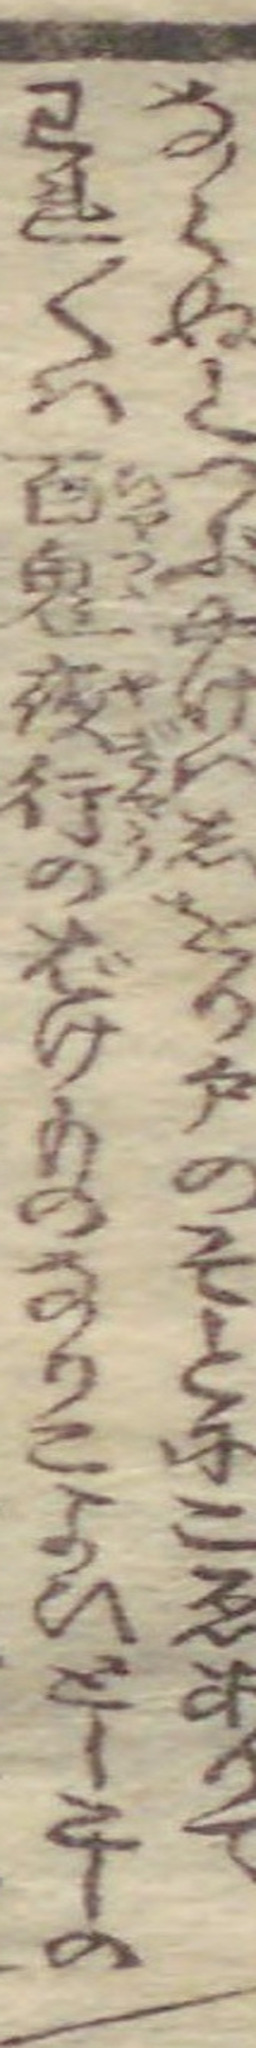われ〳〵は百鬼夜行のばけものなりこよひとしこしの
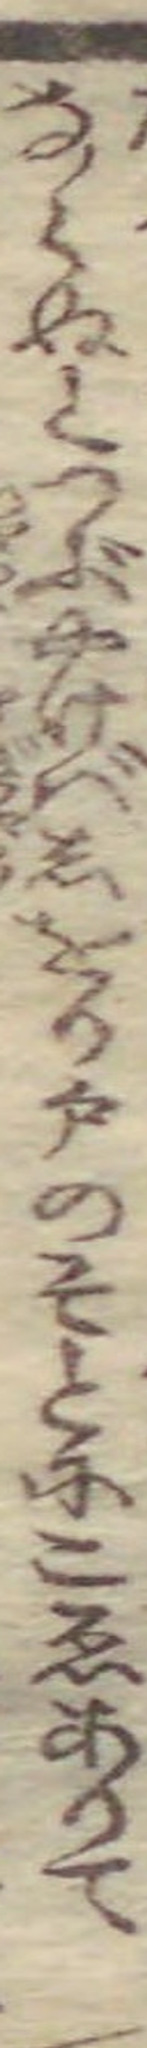ならぬとつぶやけばしをり戸のそとにこゑありて
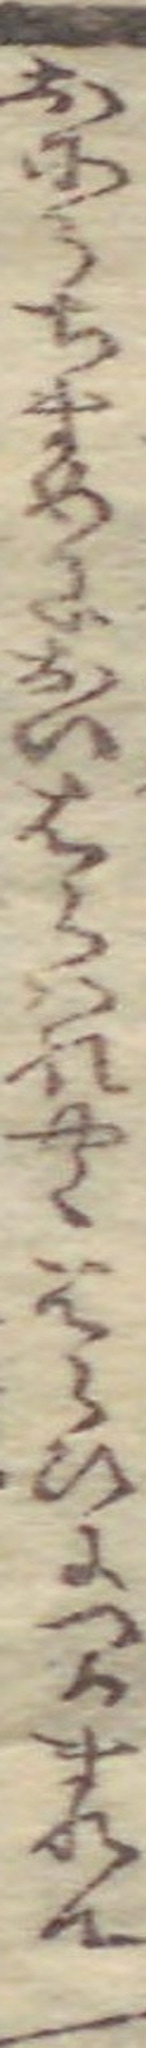おにうちまめにおいはらはれやくはらひにつかまれん
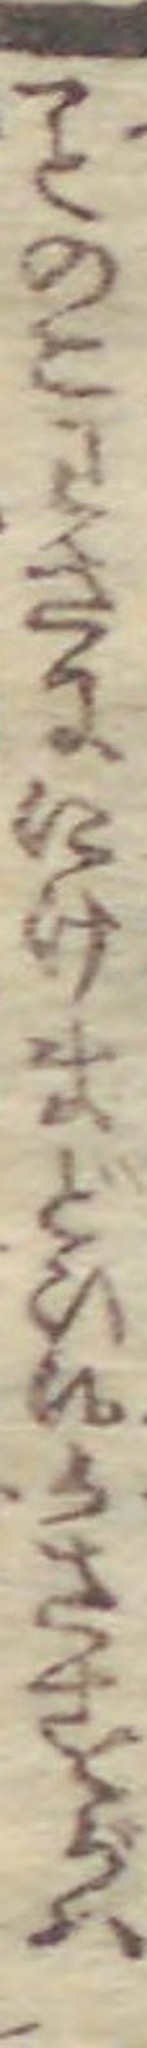ことのこわさににけまどひ候かさすがは
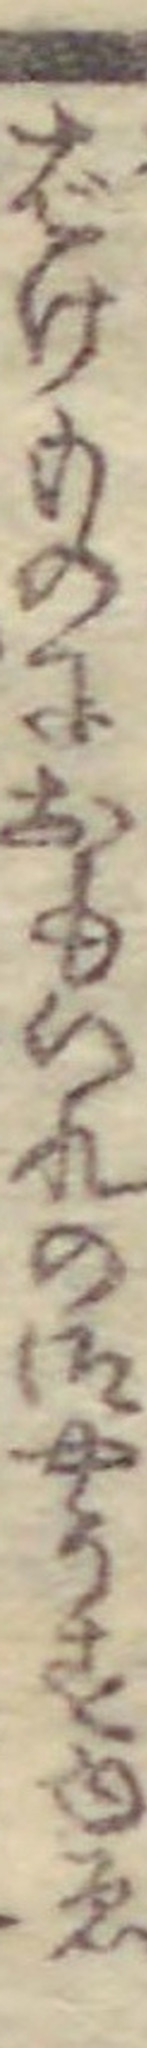ばけものにおもいれの御やうすゆゑ
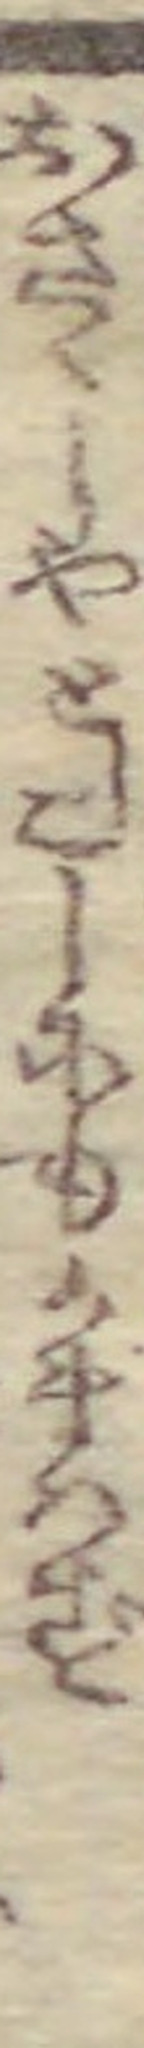おさくしやとしこしにもかまはず
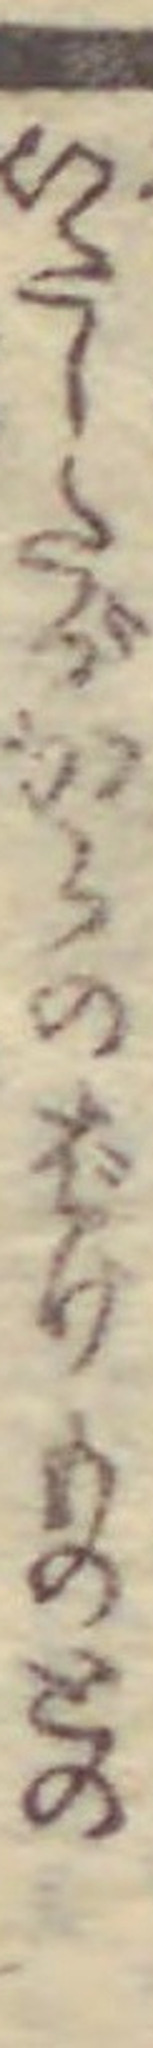いたしたがからのばけものとの
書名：大時代唐土化物 3巻. 曽我太夫染
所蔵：国立国会図書館 National Diet Library, JAPAN
